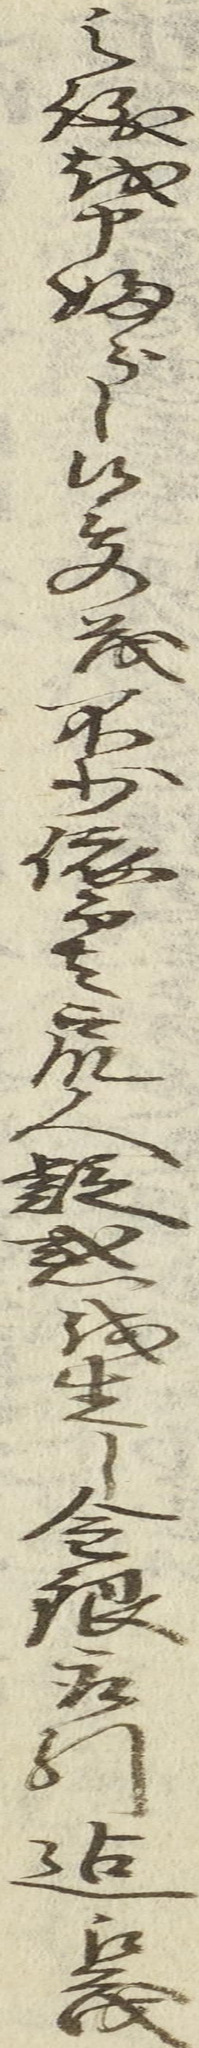之儀を申ふらし候もの茂不少依而者衆人疑惑を生し金銀取引迄江茂
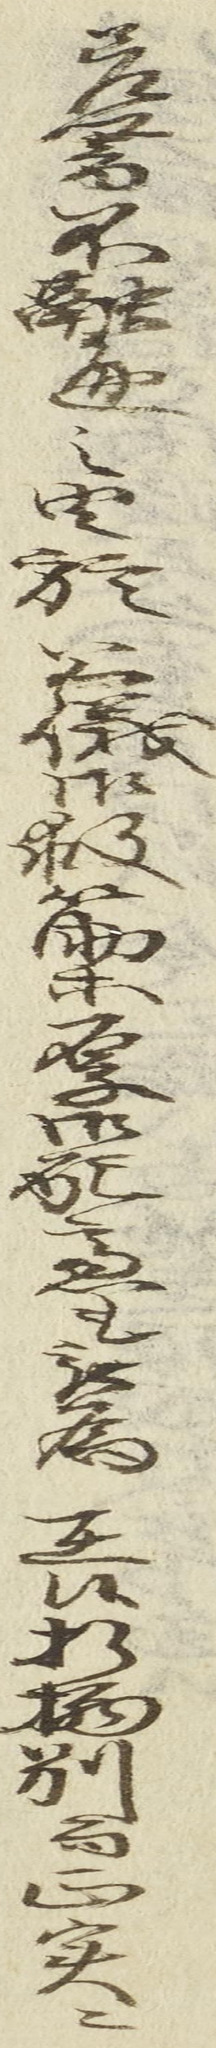差響不融通之由於公儀御救筋等厚御配慮も被為在候折柄別而正実ニ
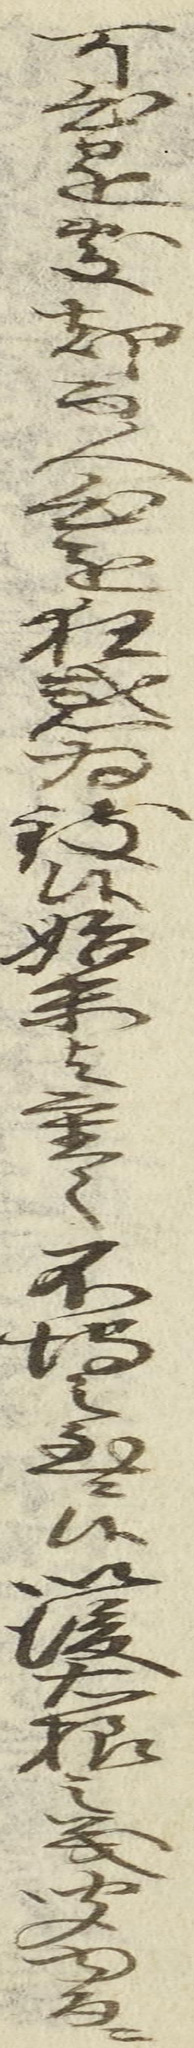可心懸処却而人心を狂惑為致候始末者重々不埒之至ニ候以後右様之義聞ゆるニ
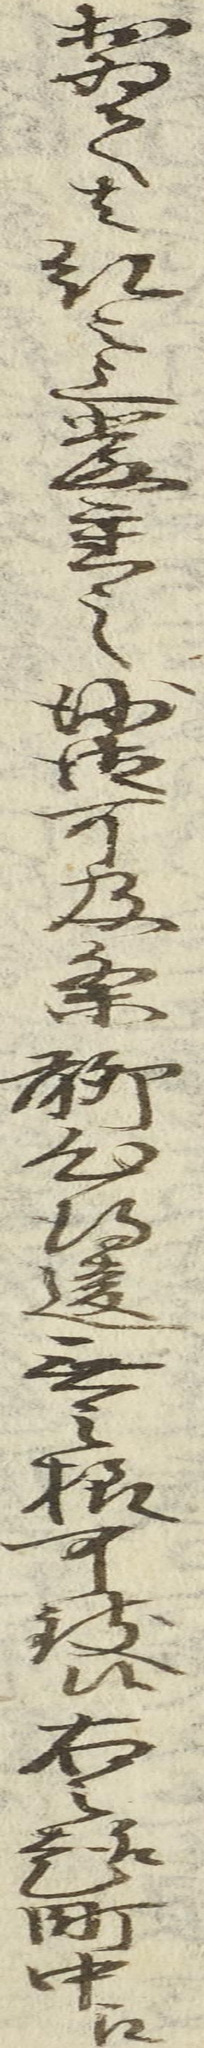於ゐて者糺之上厳重之沙汰可及条聊心得違無之様可致候右之趣町中江
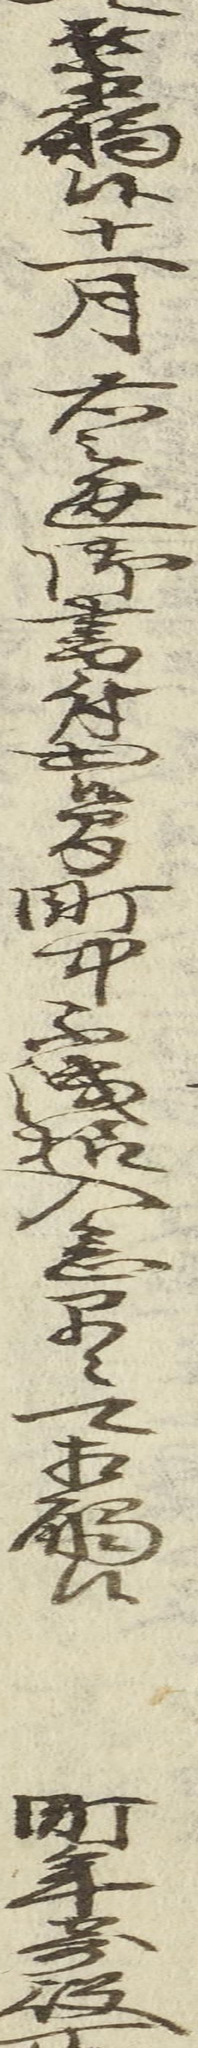可被相触候十一月右之通御書付出候間町中不洩様入念早々可相触候町年寄役所

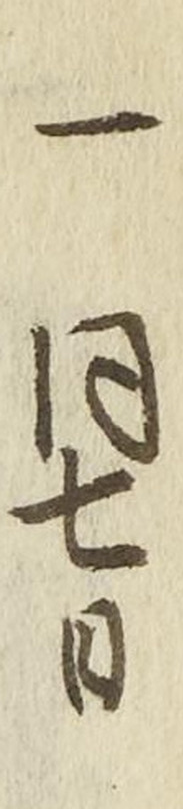一同七日
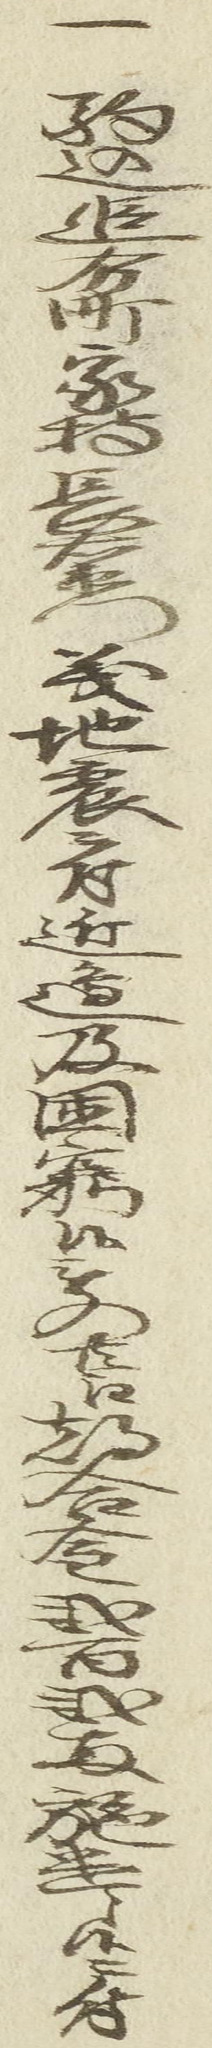一駒込追分町家持長右衛門義地震ニ付近辺及困窮候もの共江都合金弐百弐両施遣候ニ付
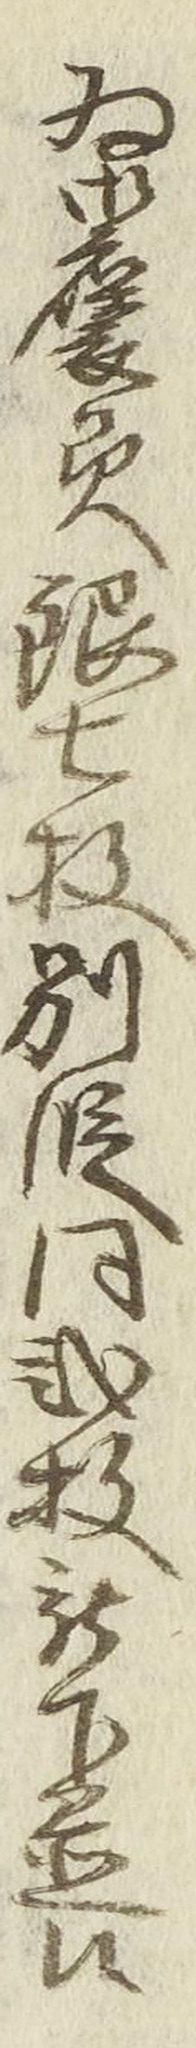為御褒美銀七枚別段同弐枚被下置候
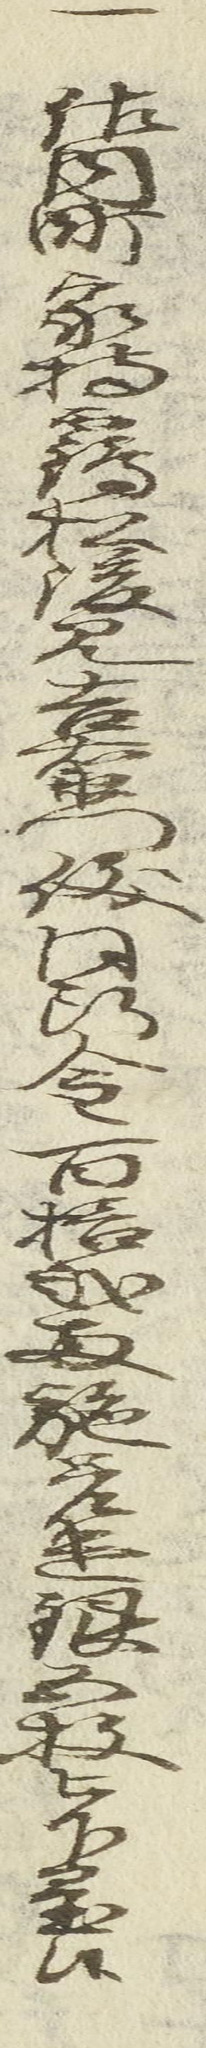一佐内町家持鶴松後見吉右衛門儀同断金百拾弐両施差遣銀五枚被下置候
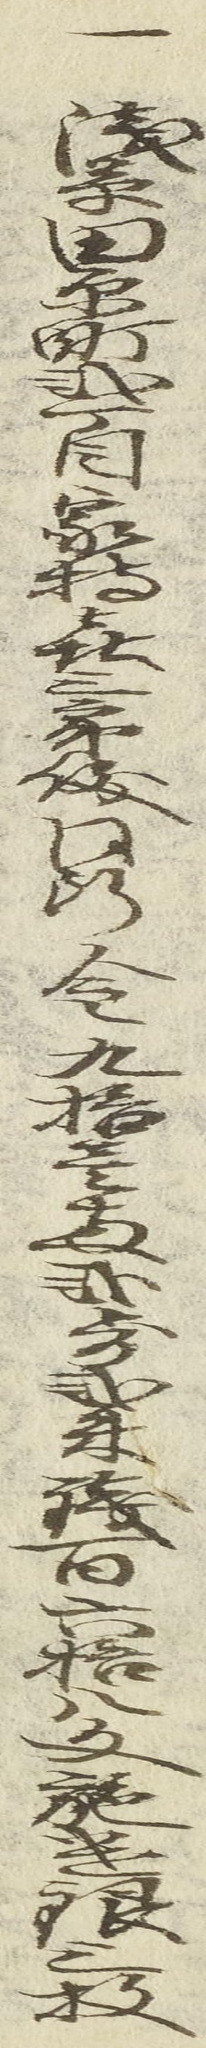一浅草田原町弐丁目家持喜三郎儀同断金九拾壱両弐歩弐朱銭百六拾八文施遣銀三枚
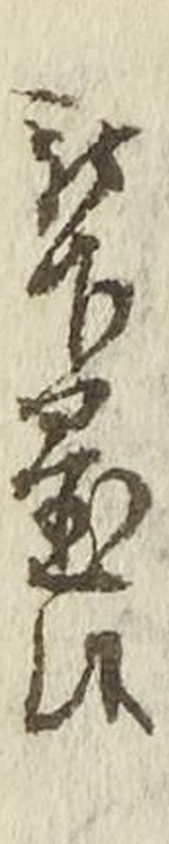被下置候
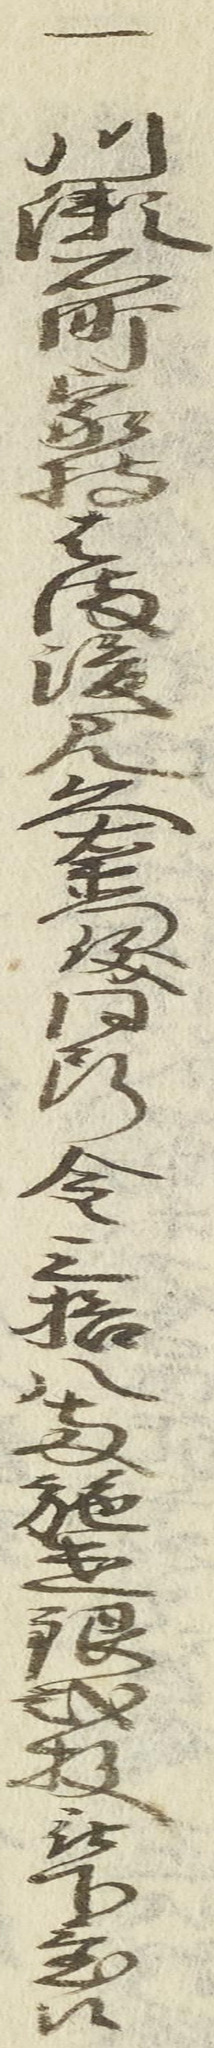一川瀬石町家持者備後見久右衛門儀同断金三拾八両施遣銀弐枚被下置候
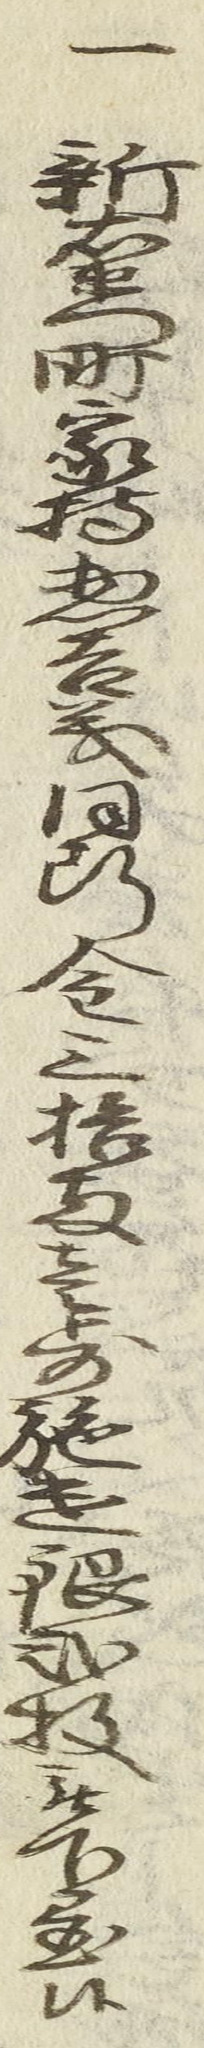一新右衛門町家持惣吉義同断金三拾両壱歩施遣銀弐枚被下置候
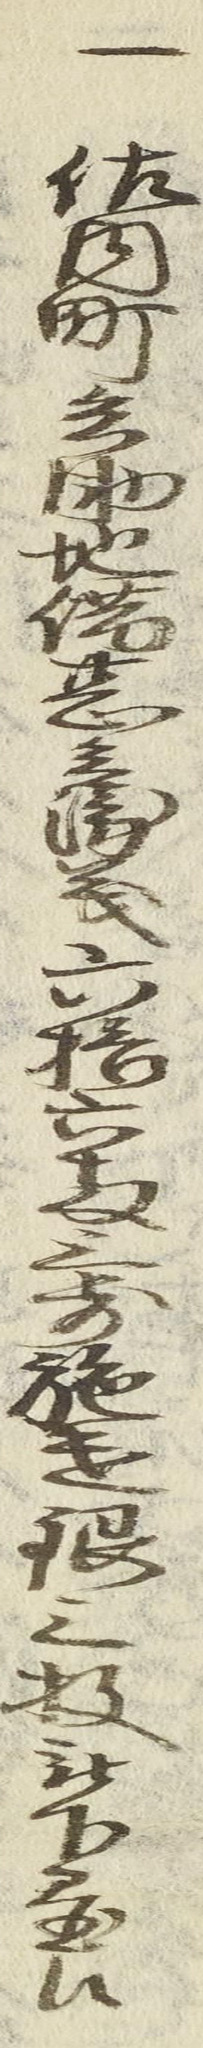一佐内町兵助地借甚兵衛義六拾六両三歩施遣銀三枚被下置候
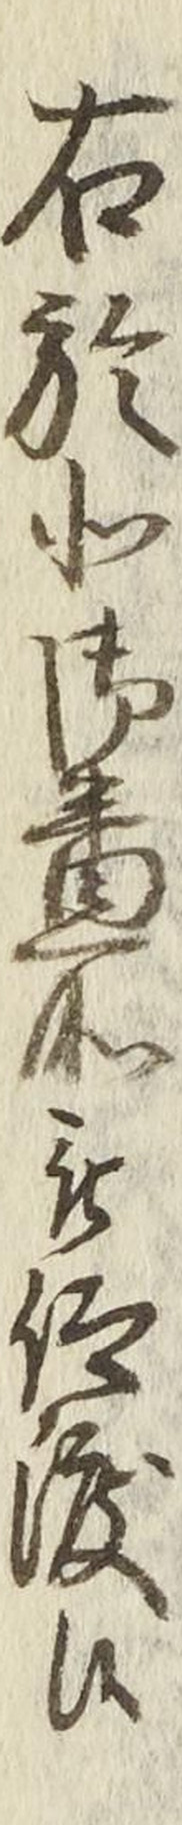右於北御番所被仰渡候
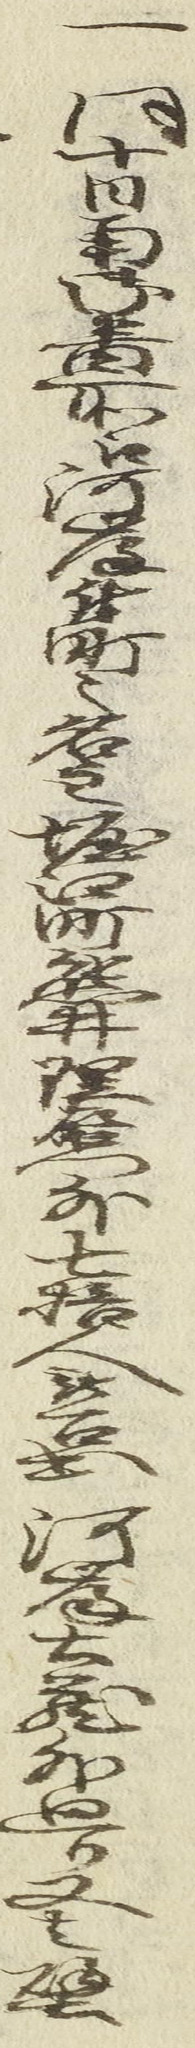一同十日南御番所江河岸付町々名主堀江町熊井理左衛門外七拾人被召出河岸土蔵外廻り又者壁
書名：安政二年震災記事　完
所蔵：東京大学地震研究所図書室 Earthquake Research Institute Library, The University of Tokyo, JAPAN
